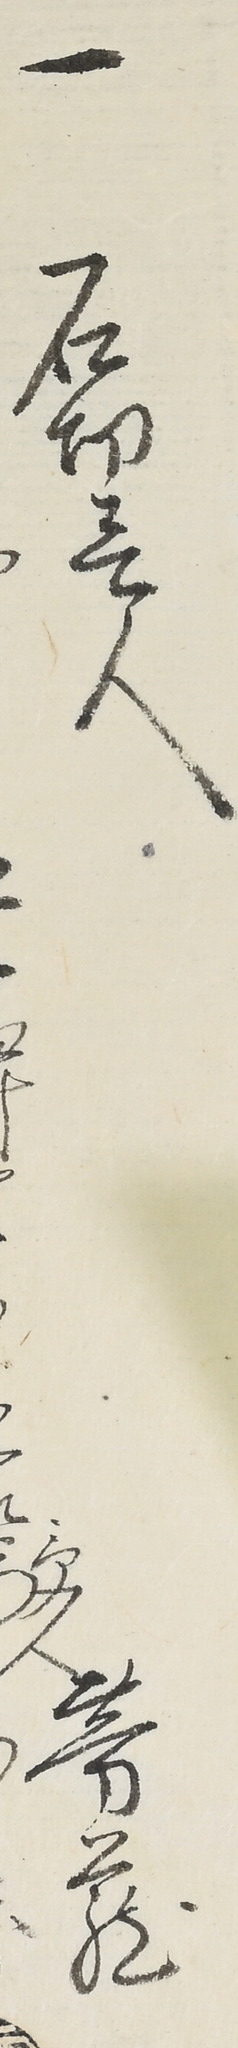一石切壱人芳蔵
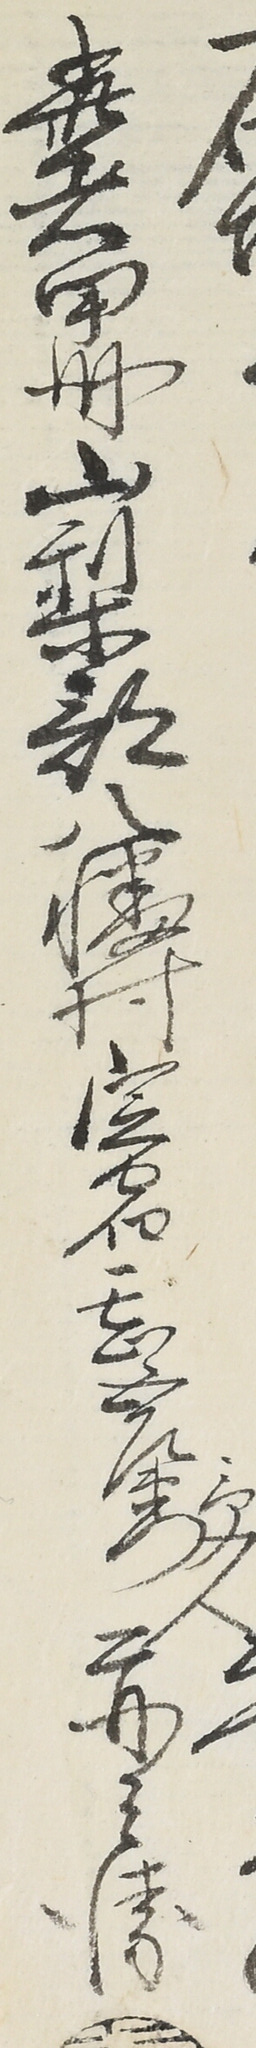此者甲州山梨郡八幡村定宿甚五左衛門亦兵衛

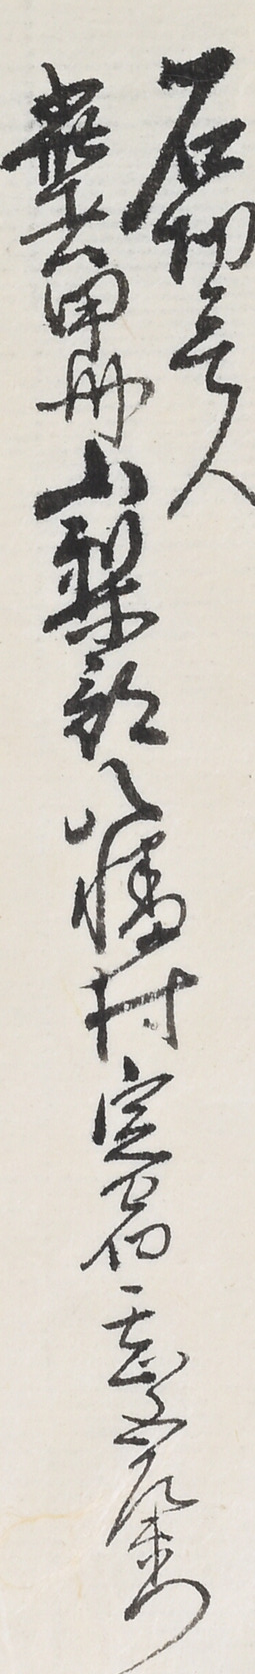此者甲州山梨郡八幡村定宿甚五左衛門
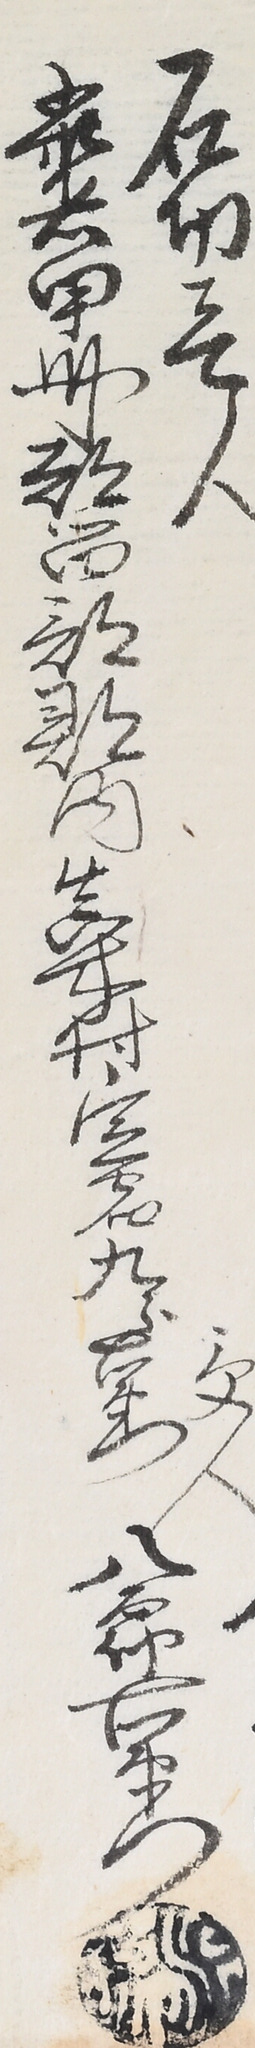此者甲州都留郡郡内真木村定宿九郎右衛門受人八郎右衛門
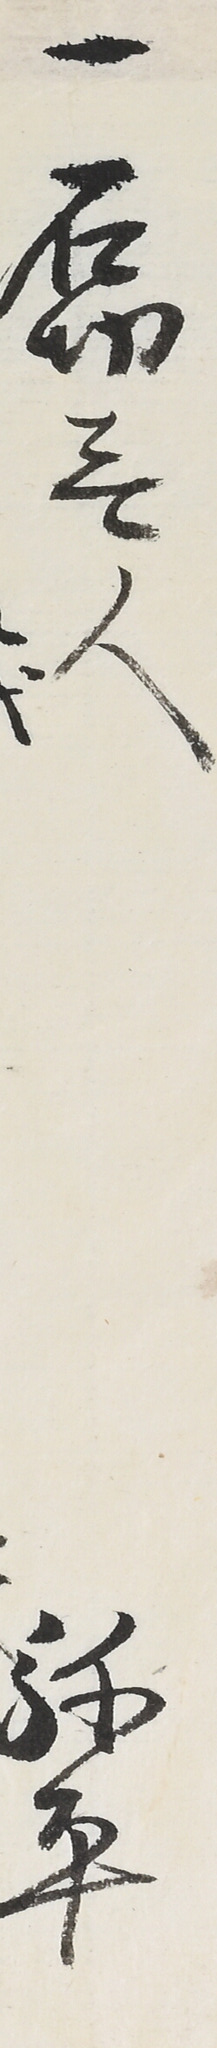一石切壱人弥平
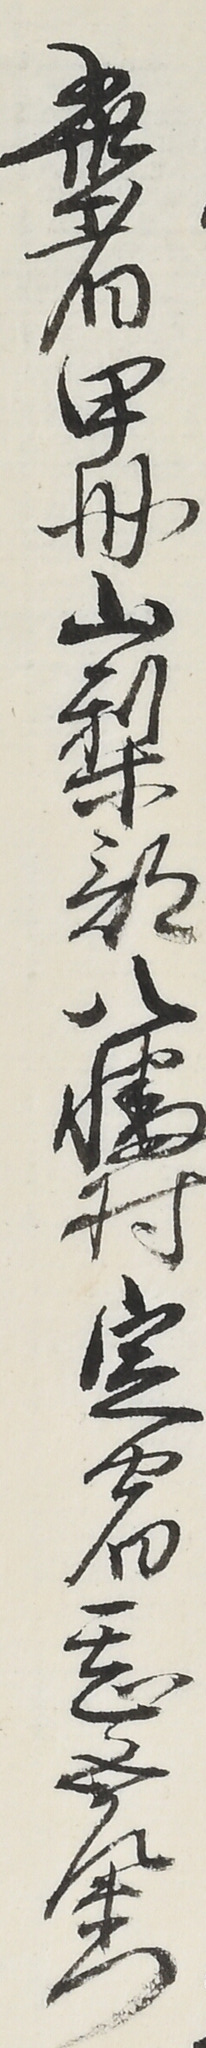此者甲州山梨郡八幡村定宿甚五左衛門
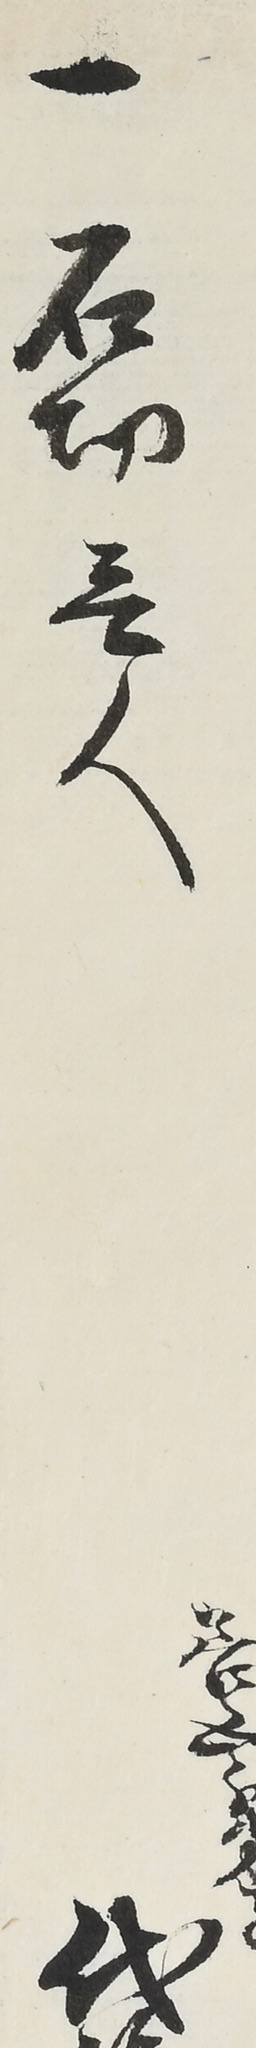一石切壱人弥平

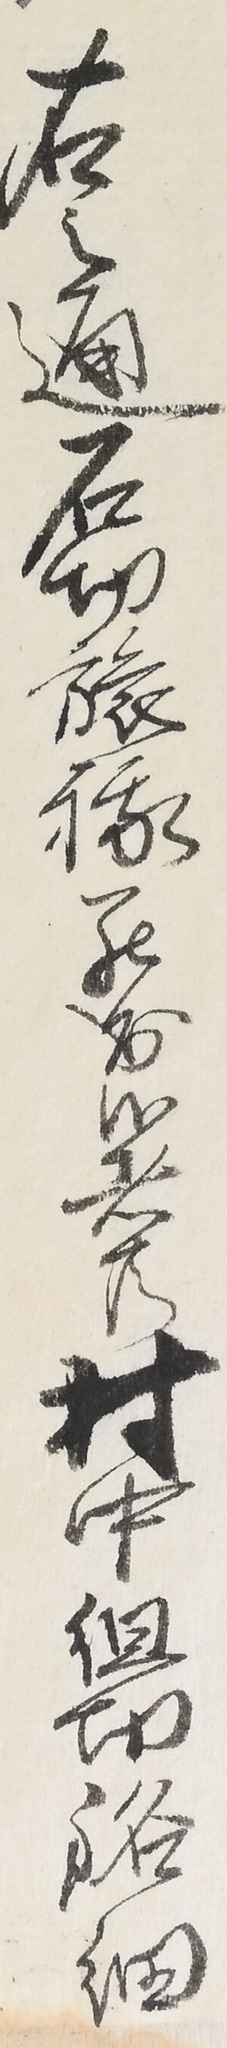右之通石切旅稼罷出候者共村中組切銘細
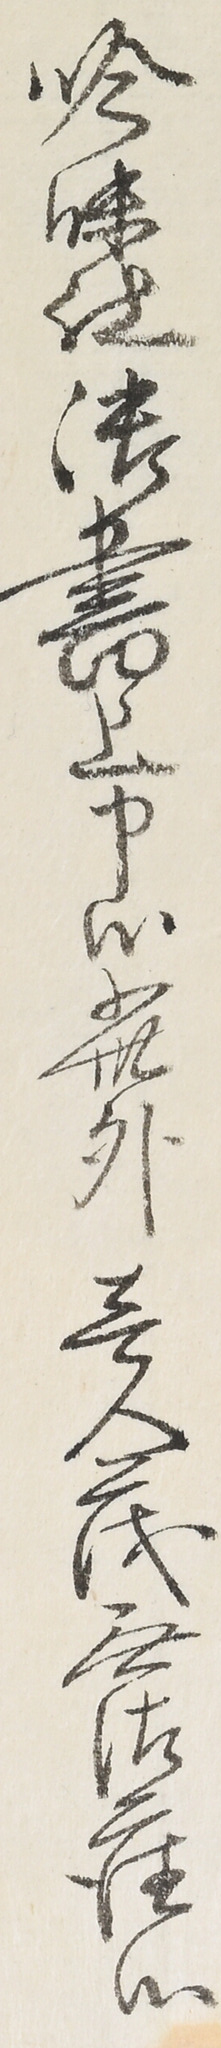吟味仕御書上申候此外壱人も無御座候
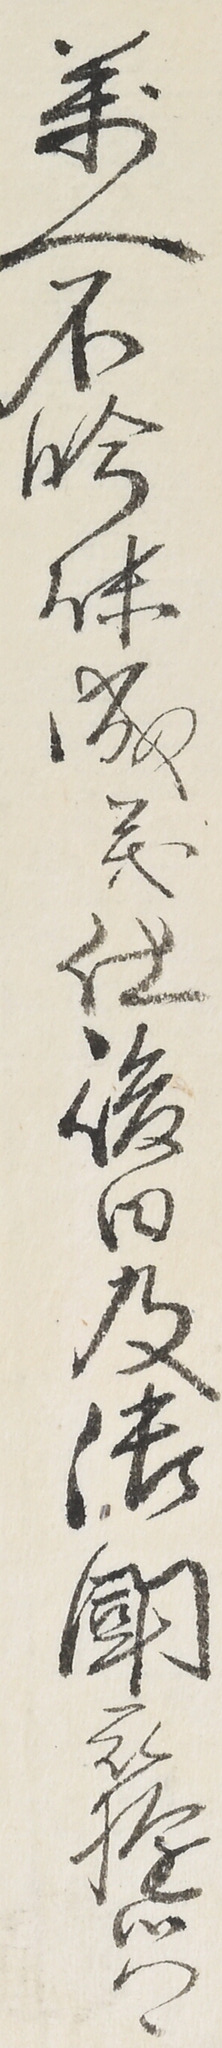万一不吟味成義仕後日及御聞被遊候ハヽ
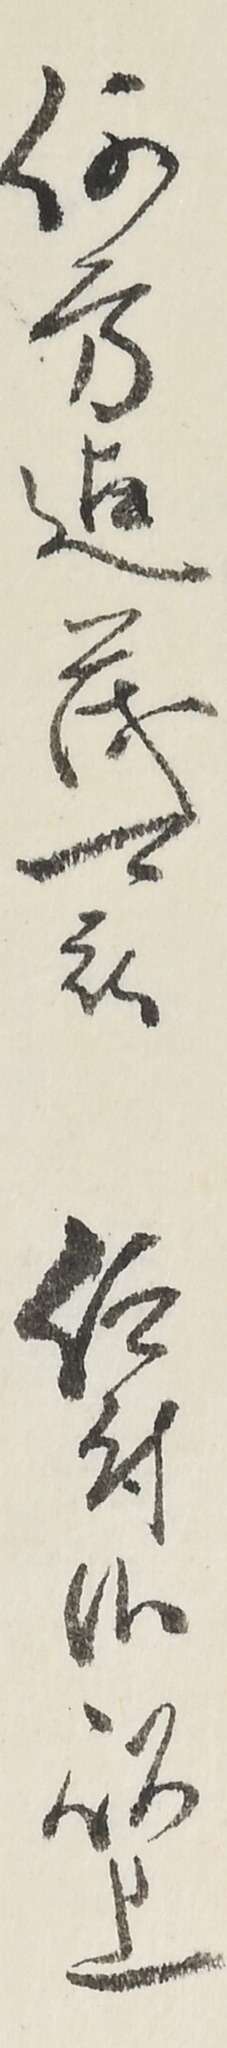何方迄も可被仰付候以上

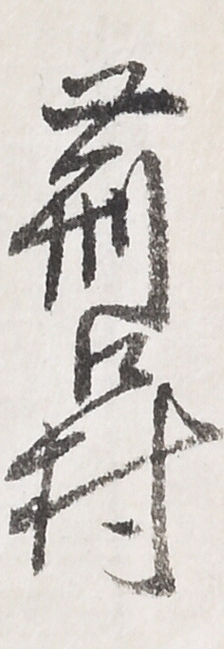荊口村
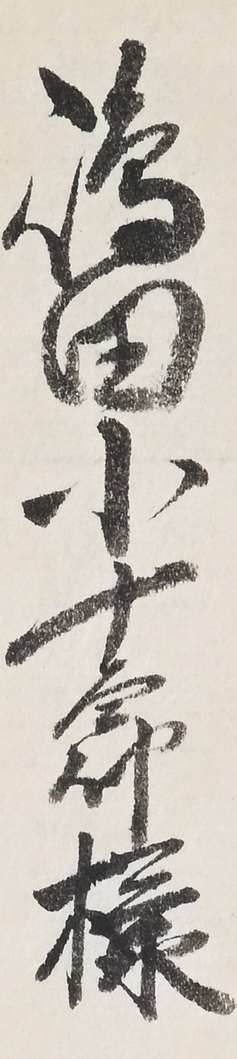島田小十郎様

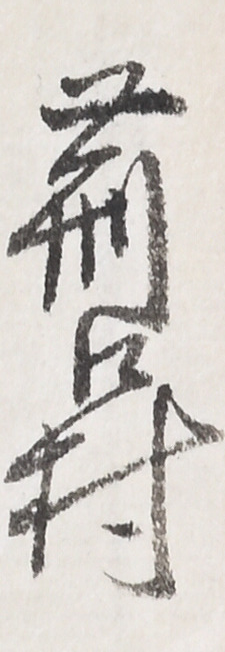荊口村
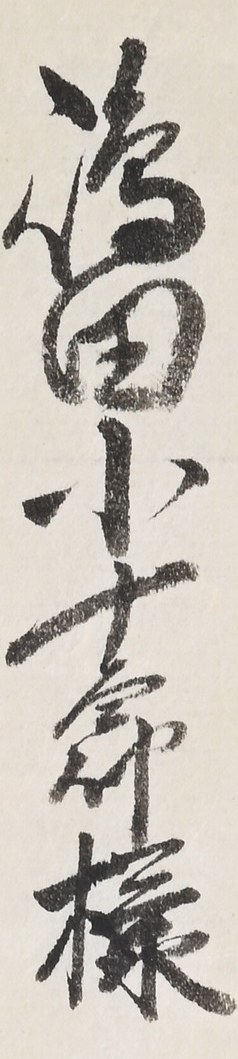島田小十郎様
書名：安政二乙卯年二月他國出石切名前書上帳
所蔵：伊那市立高遠町図書館・合同会社AMANE
